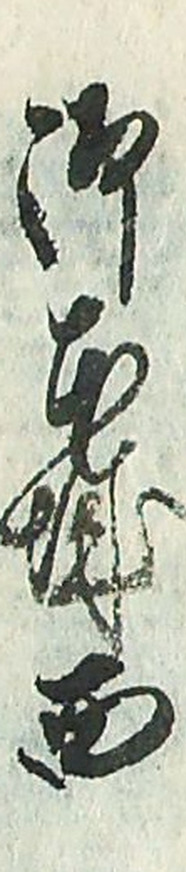御本城西
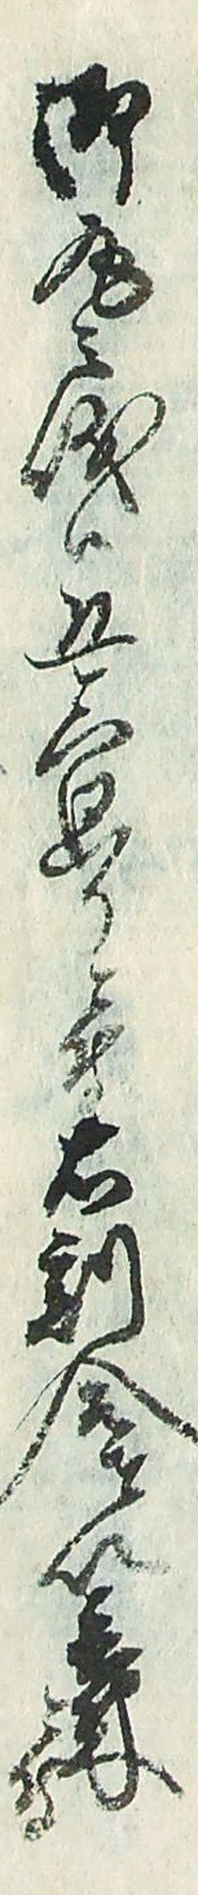御丸之儀は五尺廻りに付右割合を以一束に付

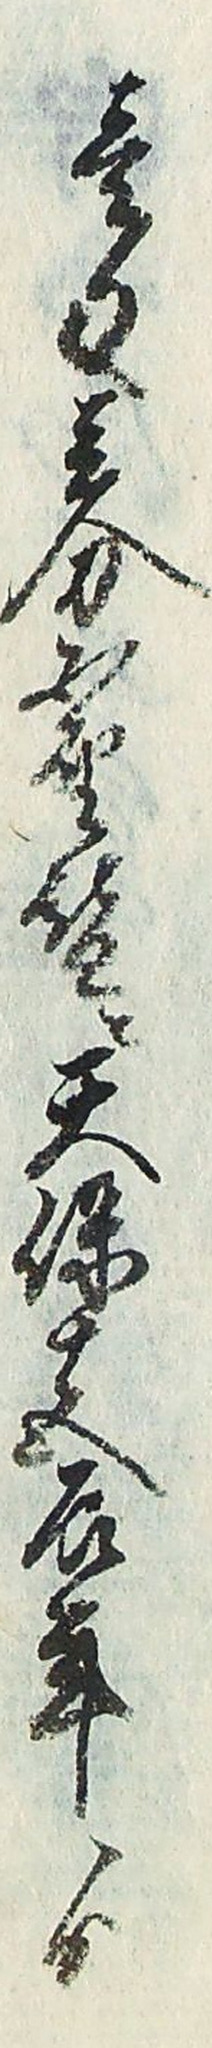一匁一分五厘替に天保十五辰年より
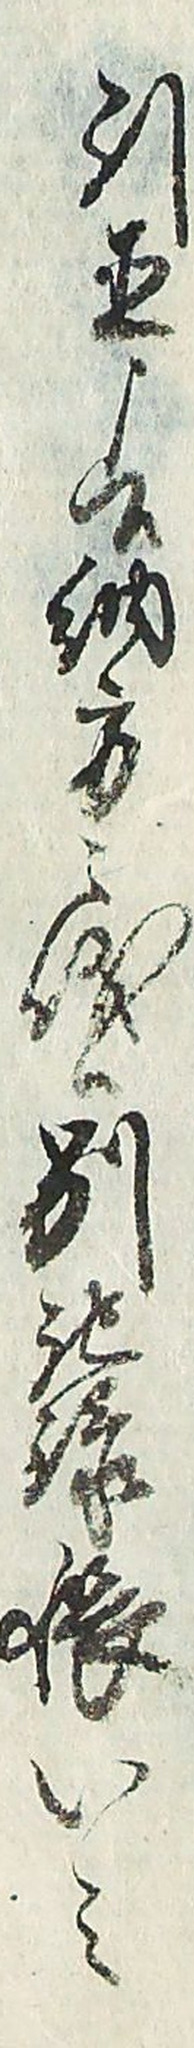引直申候納方之儀は別記録帳いみ
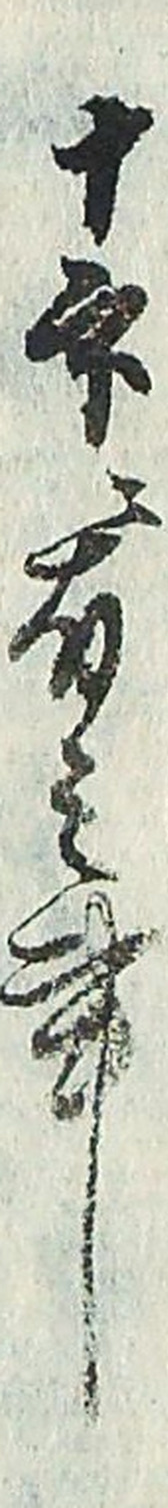十印に有之事
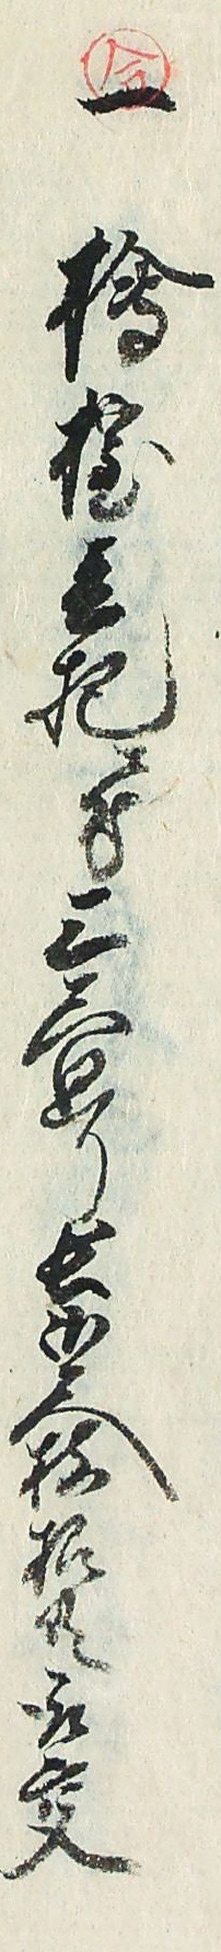一檜榁一把に付三尺廻り長二尺枝根共取交
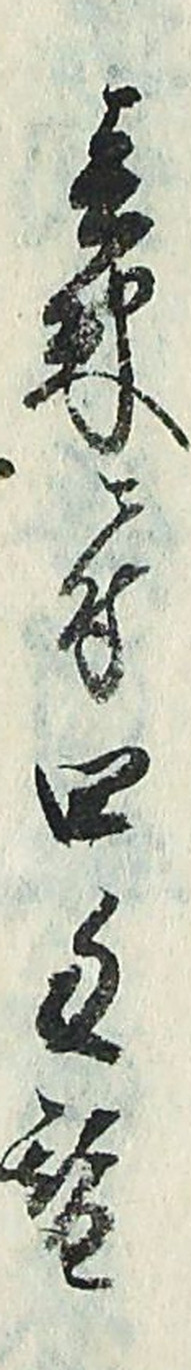一束に付四匁替
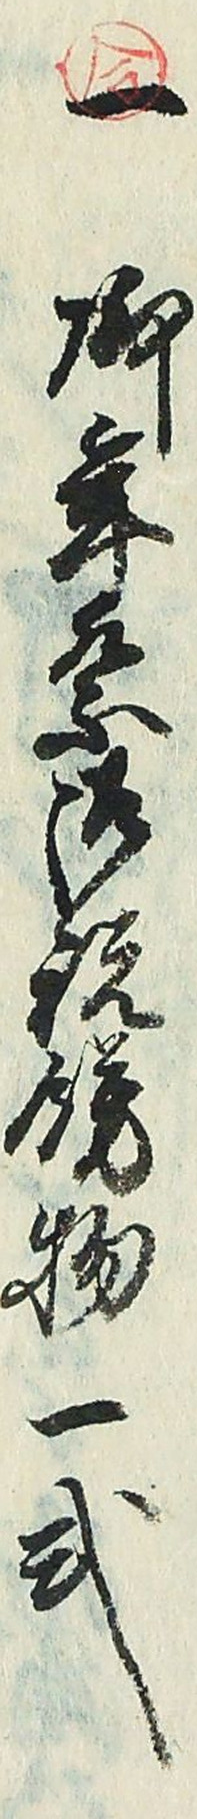一御年祭御祝錺物一式
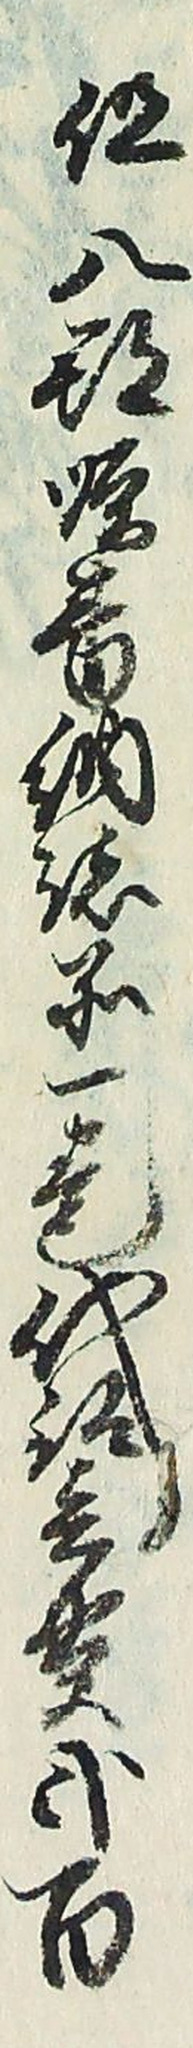但八郡順番納諸品一巻代銀一貫二百
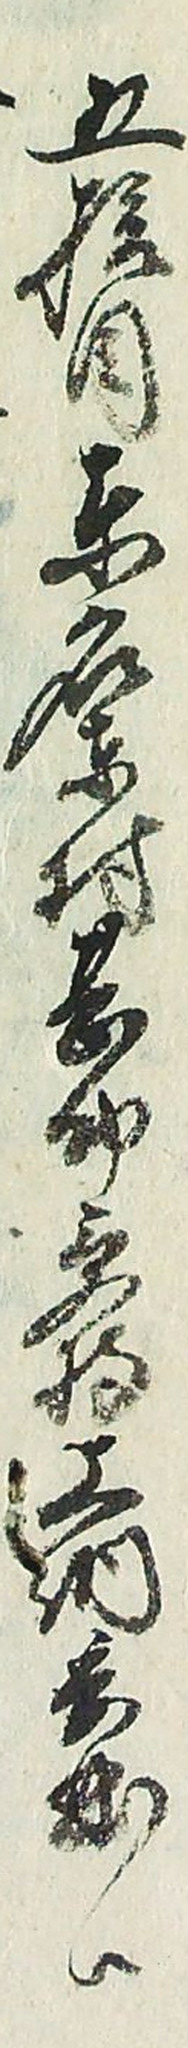五十目東名東村甚助受持上納委曲は
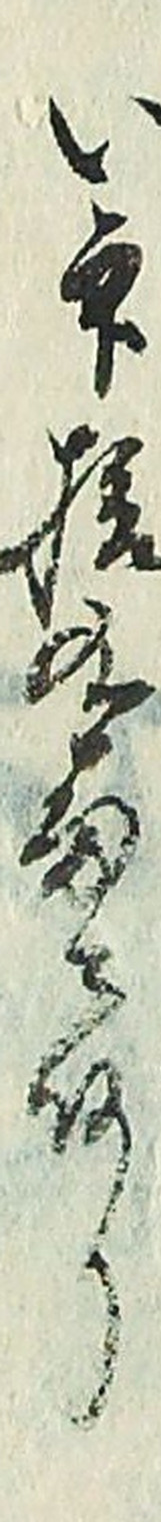い印十九番にあり
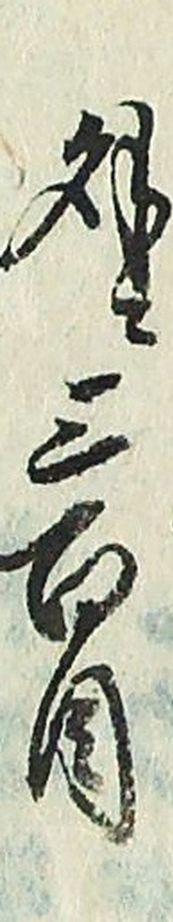外に三百目
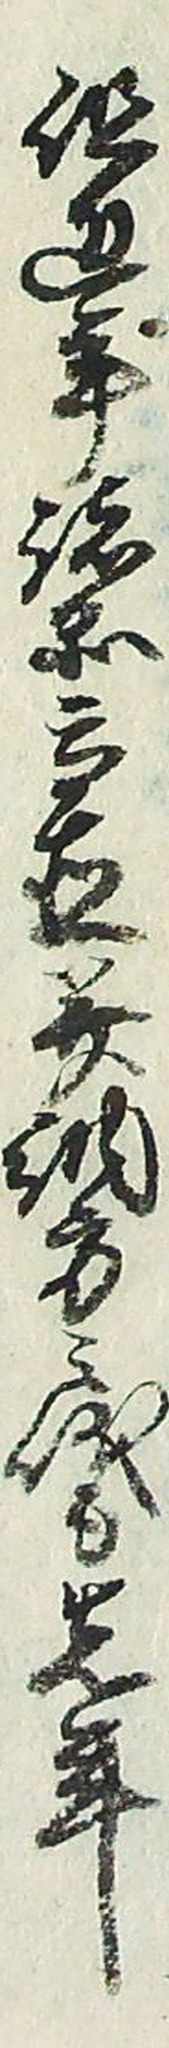但近年諸品高直并納方之儀も先年
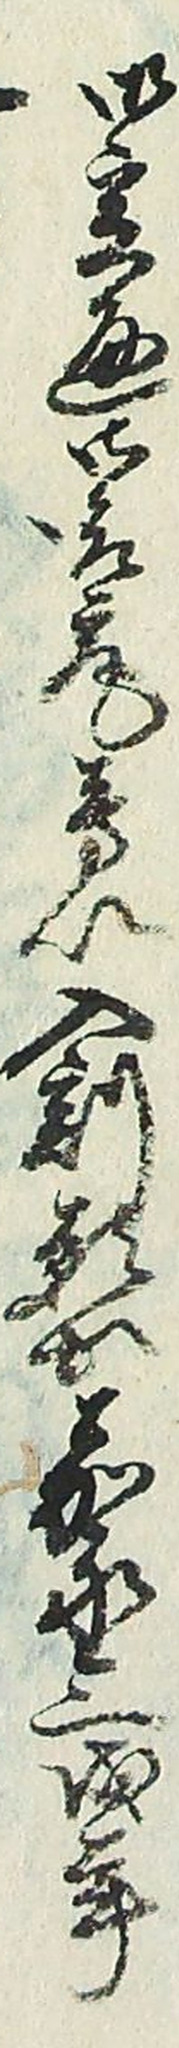御定通御取究旁以入割願出嘉永三戌年
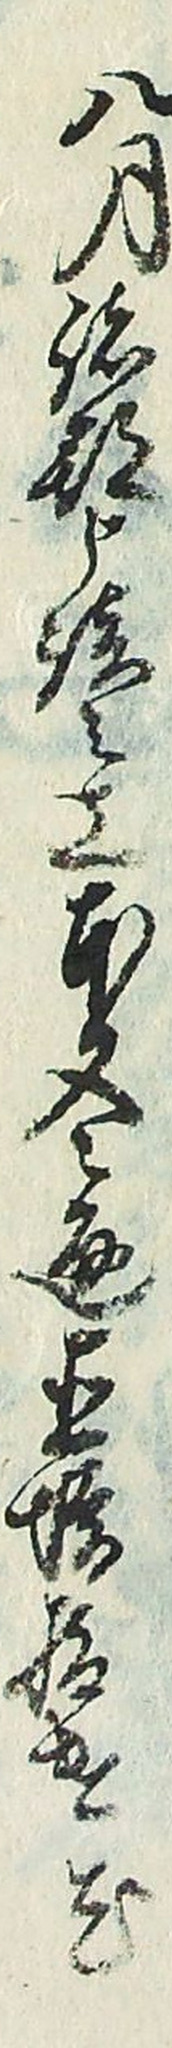八月諸郡申談之上本文の通り直増指遣尤
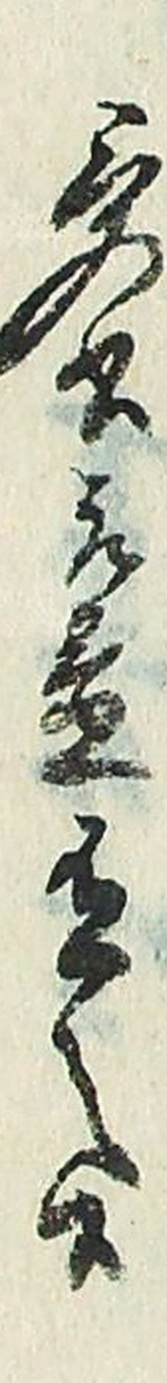受書取置有之候
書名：諸割賦物賃銀定記録帳
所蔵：鳴門教育大学 Naruto University of Education
